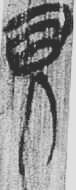貝
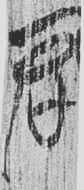君
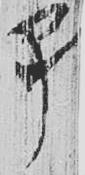子
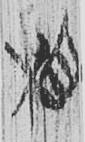相
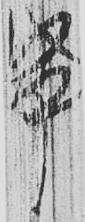好
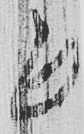㠯（以）
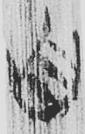自
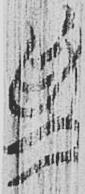爲
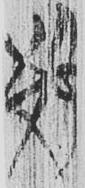○（慧）
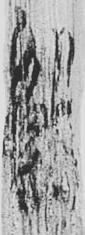○（愷）
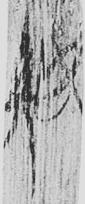○（豫）
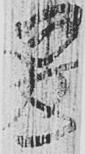是
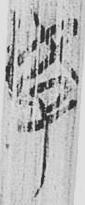好
